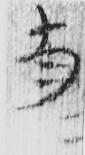十月
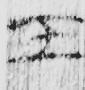壬
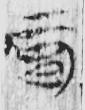晨
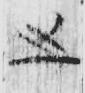之
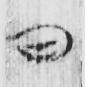日
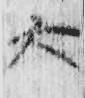大
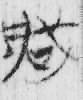戕
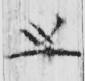之
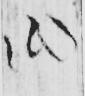州
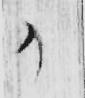人
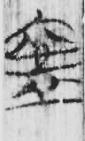寧
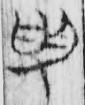受
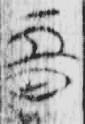○（期）
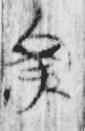○（爨）
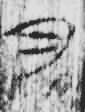月
